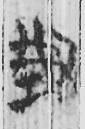型
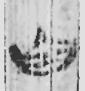自
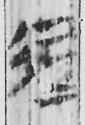起（起）
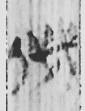俴
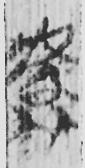{虎口䖵}
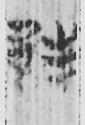邦
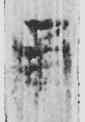甬
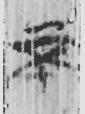不
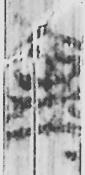{穴心皿}（寧）
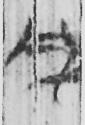凡
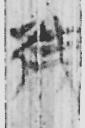隹
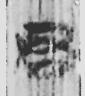君
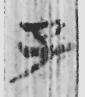子
